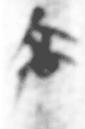高
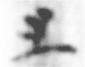之
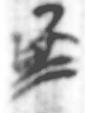爲
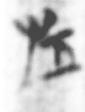○（左）
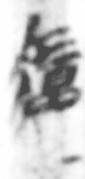驂
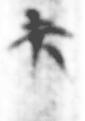夫
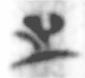之
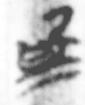爲
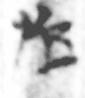○（左）
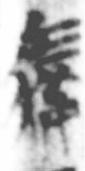○（服）
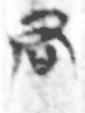君
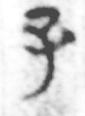子
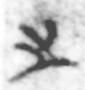之
